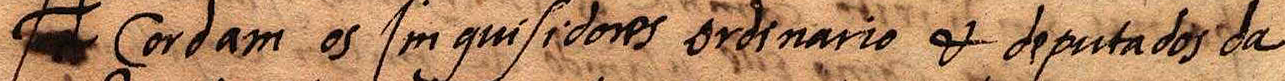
Acordam os Jmquisidores ordinario & deputados da
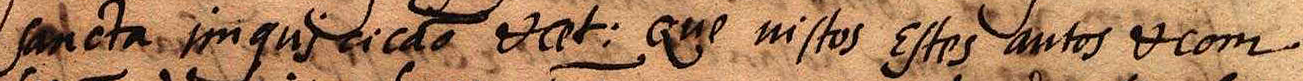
sancta imquiciçaõ &cet: Que uistos Estes autos & com
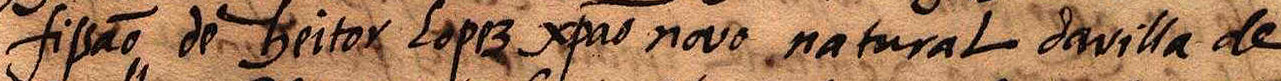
fissão de heitor Lopez xpão novo naturaL da villa de
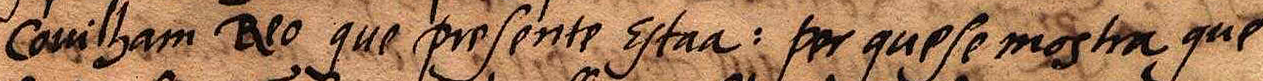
Couilham Reo que presente Estaa: per que se mostra que
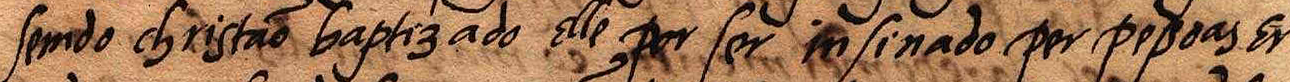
semdo christaõ baptizado Elle por ser insinado per pessoas Er
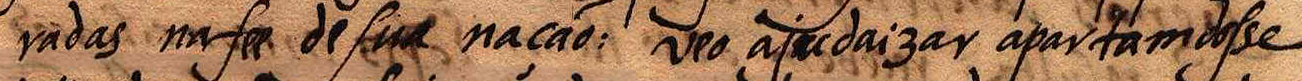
radas na fee de sua naçaõ: veo a judaizar apartamdosse
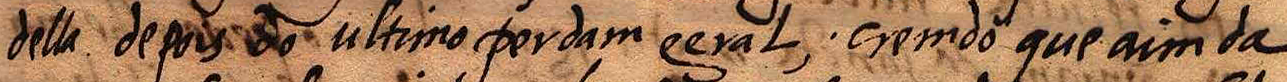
della depois do ultimo perdam geral; cremdo que aimda
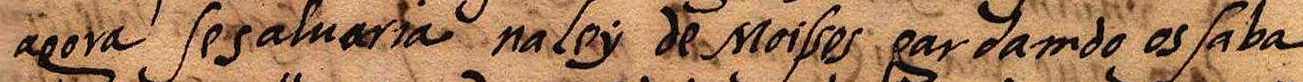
agora se saluaria na ley de Moisses gardamdo os saba
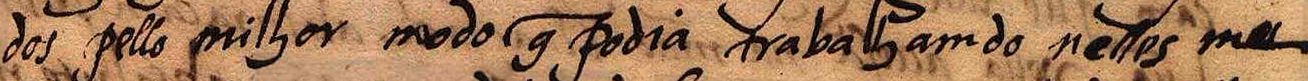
dos pello milhor modo q̄ podia trabalhamdo nelles me
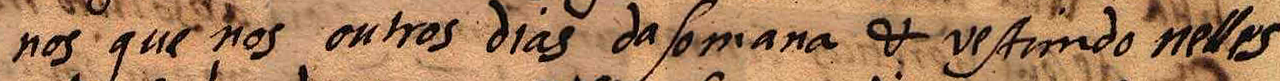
nos que nos outros dias da somana & vestimdo nelles
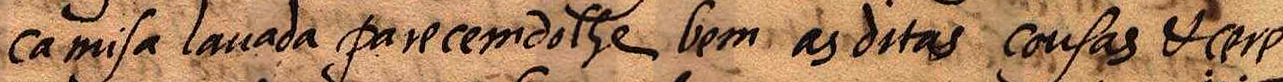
camisa lauada parecemdolhe bem as ditas cousas & cere
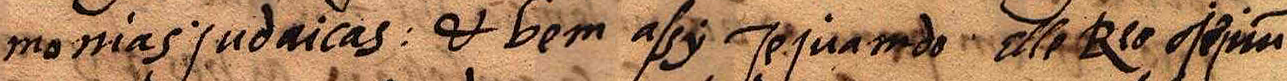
monias judaicas: & bem assy Jejuamdo Elle Reo o jejuū
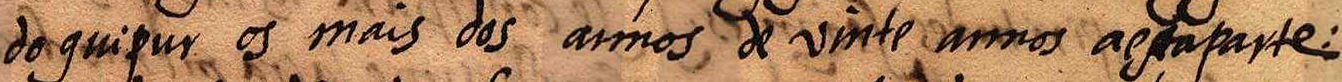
do quipur os mais dos annos de vinte annos a esta parte:
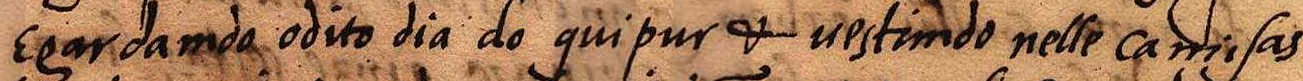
E gardamdo o dito dia do quipur & uestimdo nelle camisas
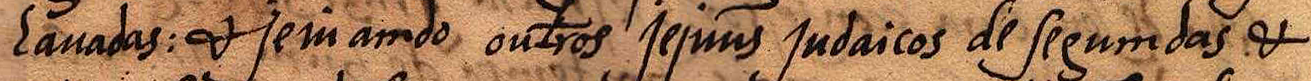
lauadas: & jeiuamdo outros jejuūs judaicos de segumdas &
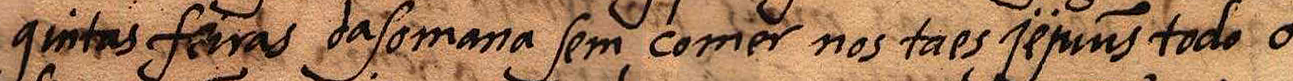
qintas feiras da somana sem comer nos taes jejuūs todo o
